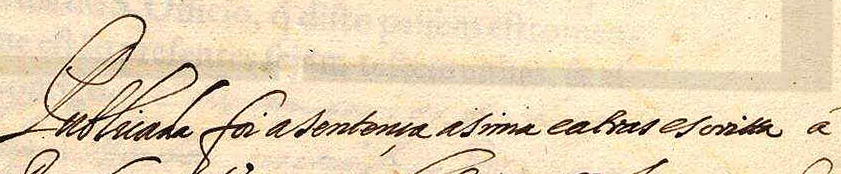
Publicada foi a sentença asima e atras escritta á
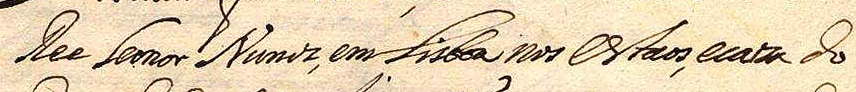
Ree Leonor Nunez, em Lisboa nos Estaos, e caza do
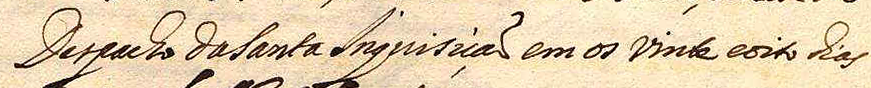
Despacho da Santa Inquisiçaõ em os vinte e oito dias
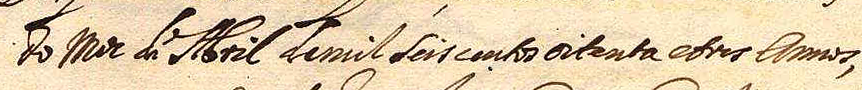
do mez de Abril de mil seiscentos oitenta e tres Annos,
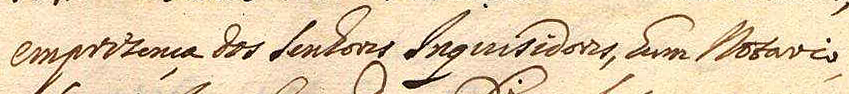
em prezença dos senhores Inquisidores, hum Notario
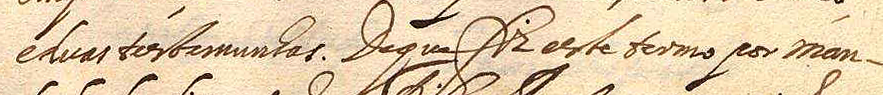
e duas testemunhas. De que fiz este termo por man
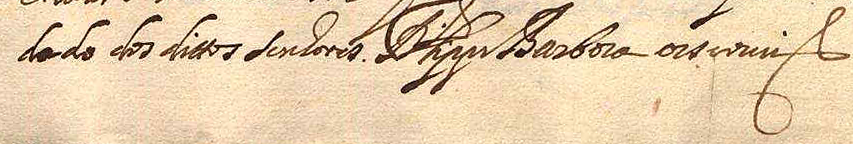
dado dos dittos senhores Filippe Barboza o escreui
